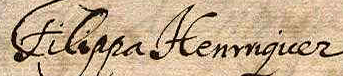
Filippa Henrriquez
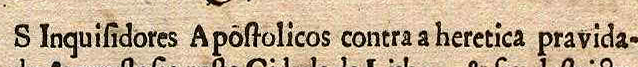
S Inquisidores Apostolicos contra a heretica pravida
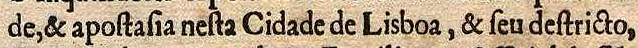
de, & apostasia nesta Cidade de Lisboa, & seu destricto,
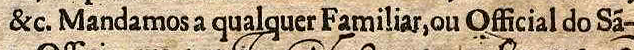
&c. Mandamos a qualquer Familiar, ou Official do Sā
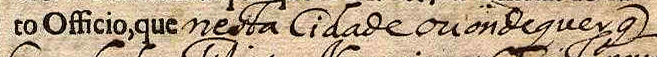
to Officio, que nesta Cidade ou onde quer q̄
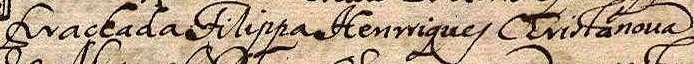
for achada Filippa Henrriques Christã noua
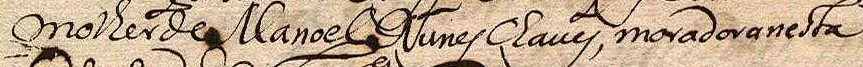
molher de Manoel Nunes Chaues, moradora nesta
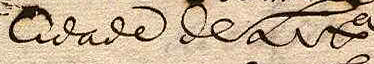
Cidade de Lixa
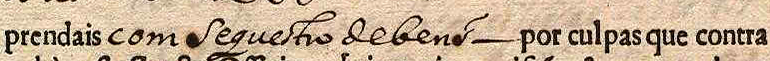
prendais com sequestro de bens - por culpas que contra
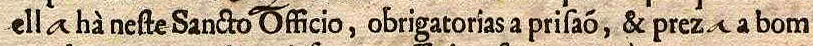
ella hà neste Sancto Officio, obrigatorias a prisaõ, & preza a bom
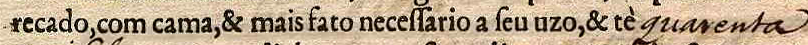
recado, com cama, & mais fato necessario a seu uzo, & tè quarenta
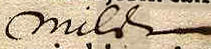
mil rs
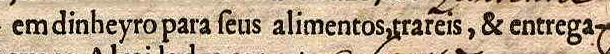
em dinheyro para seus alimentos, trareis, & entrega
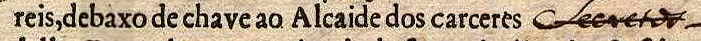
reis, debaxo de chave ao Alcaide dos carceres secretos
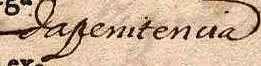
da penitencia
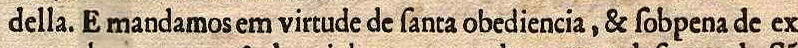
della. E mandamos em virtude de santa obediencia, & sob pena de ex
